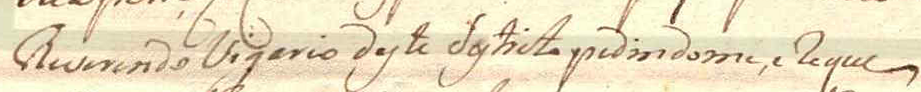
Reverendo Vigario deste destricto pedindome, e Reque
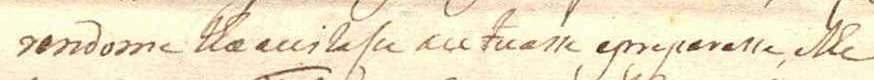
rendome lha aceitasse autuasse e preparasse, e lhe
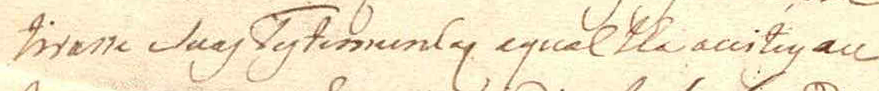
tirasse suas Testemunhas a qual lhe aceitey au
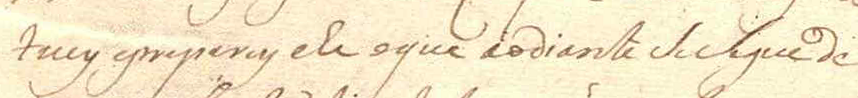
tuey, e preparey e he o que ao diante Se Segue de
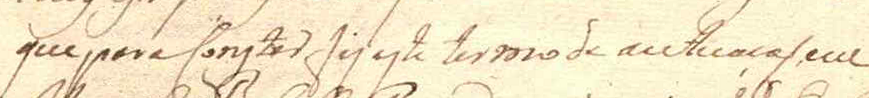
que para Constar fis este termo de autuçaõ, e eu
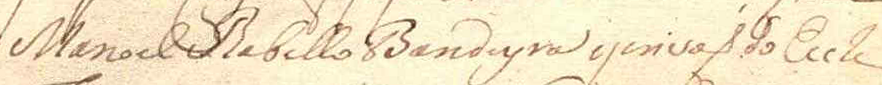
Manoel Rabello Bandeyra escrivaõ do Eccle
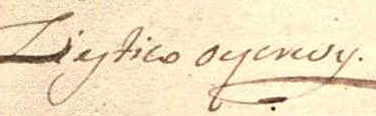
Ziastico o escreuy.
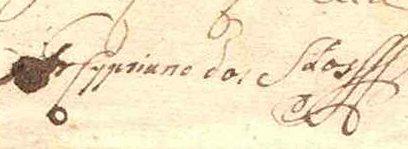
Fr Cypriano dos S.tos
